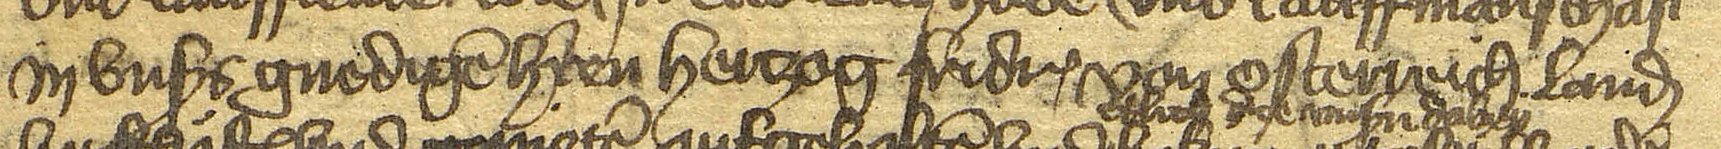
in vnſ*s gnedige* h*ren hercʒog fridr* von Oſterreich land*
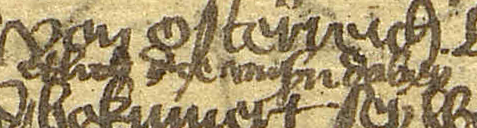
etlich die vnſ*n dabey
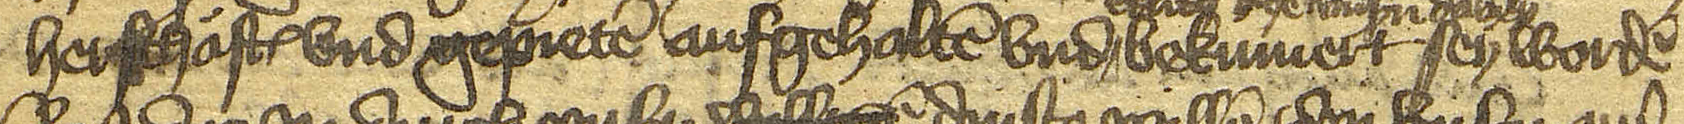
herſchäft* vnd gepiete* aufgehalte* vnd bekumert ſey worde*
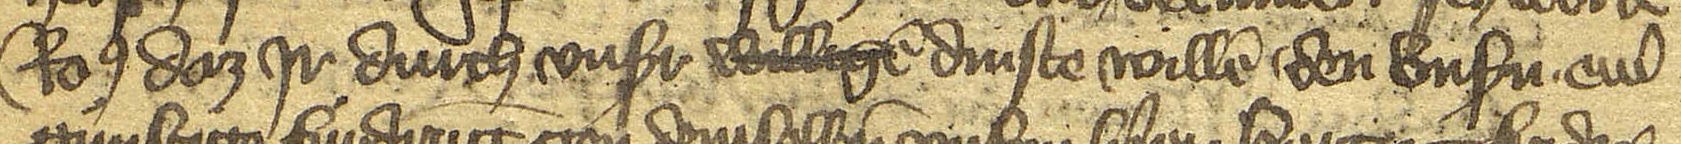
Ro* daʒ Ir durch vnſ*r willige* dinſte wille* / den vnſ*n ew*
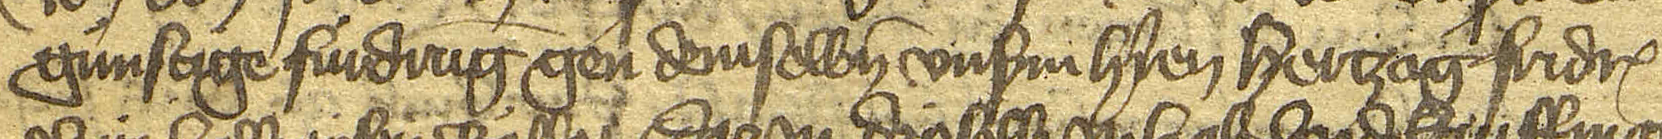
günſtige fürdrug* gen demſelbn* vnſ*m h*ren hercʒog fridr*
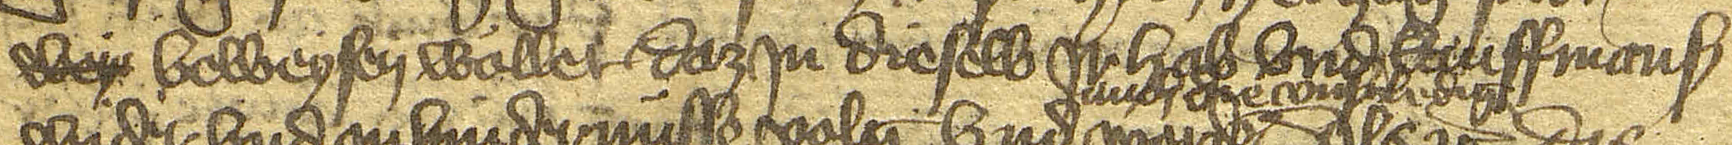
wey beweyſen wöllet / daʒ In dieſelb Ir hab vnd kauffmanſ*
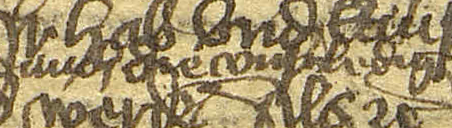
vnd die vnſ*n ledig
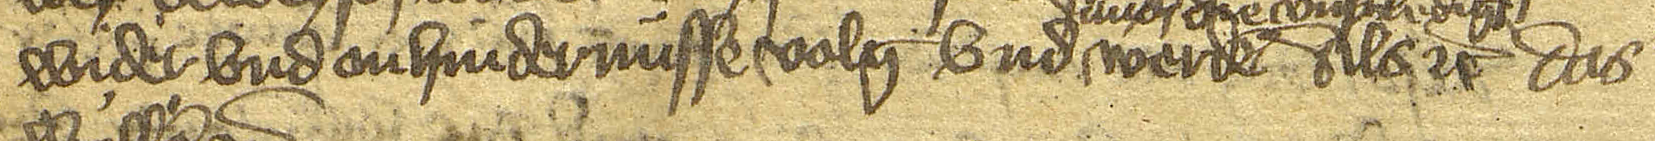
wider vnd on hindernüſſe volg vnd werde Als ec* das
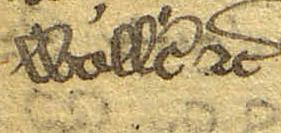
wölle* ec*
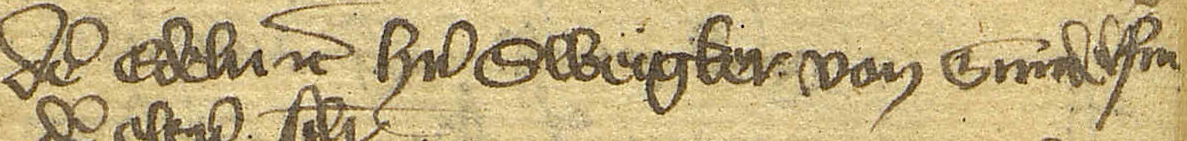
De* Edeln ec* hn* Sweigker von Gundelfin
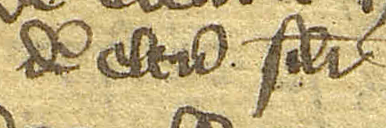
d* eltn* ſilr*
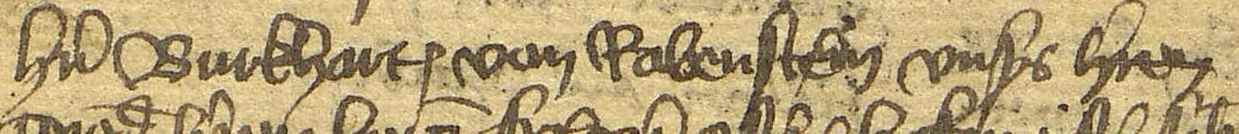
hn* Burkhart* von Rabenſtein vnſ*s h*ren
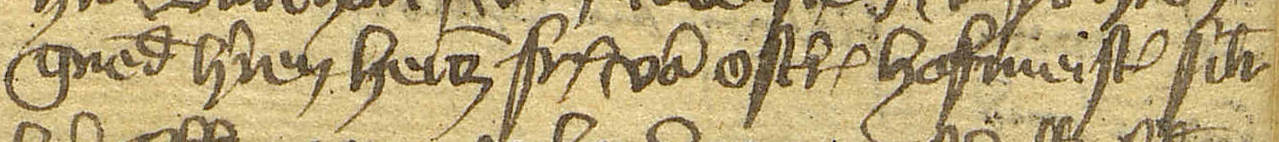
gned* h*ren hercʒ* fr* vo* Oſt*r* hofmeiſt* ſilr*
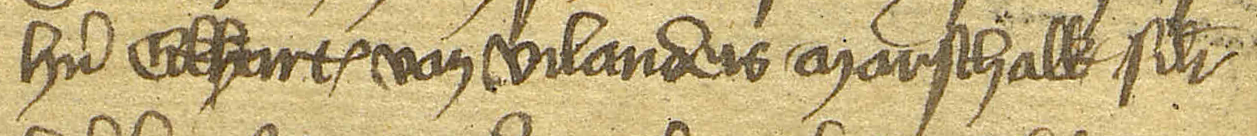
hn* Eckhart* von Vilanders / Marſchalk* ſilr*
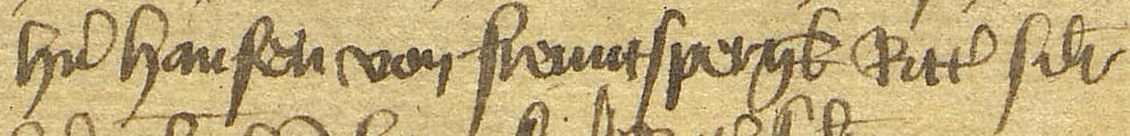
hn* hanſen von freuntſpergk Ritt* ſilr*
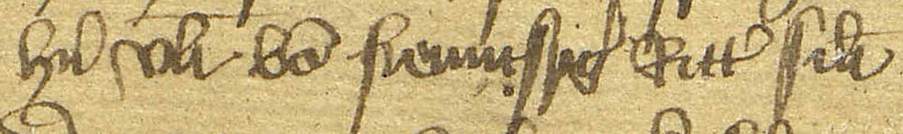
hn* vlr* vo* freuntſpg* Ritt* ſilr*
